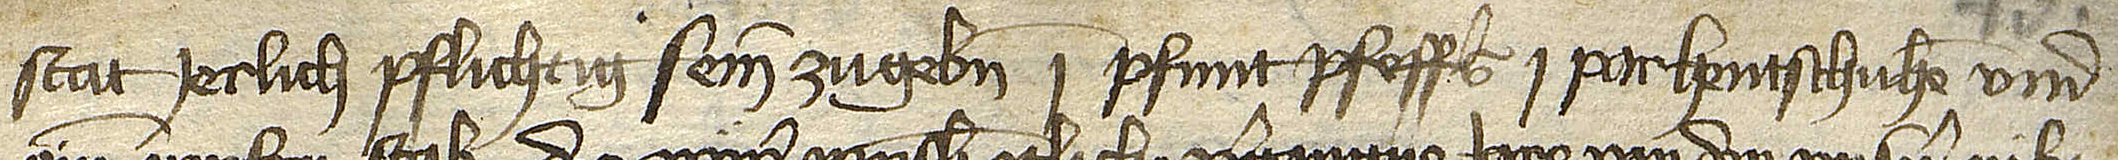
ſtat Ierlich pflichtig ſein ʒugebn* i pfunt pfeff*s i par hentſchuhe* vnd
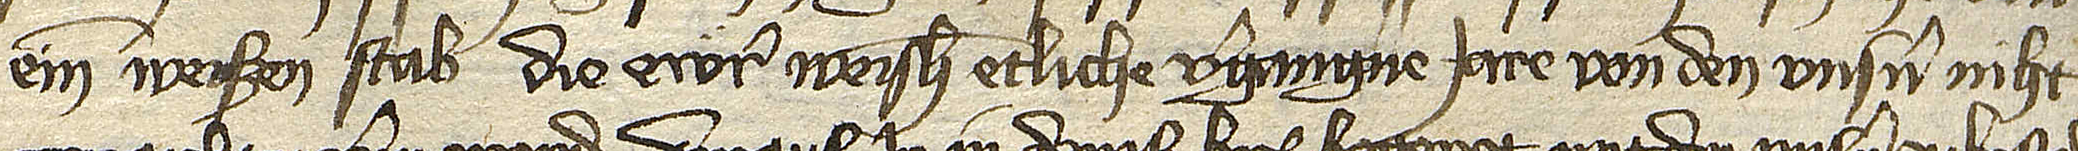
ein* weiſʒen ſtab die eẅr* weiſh* etliche v*gangne Iare von den vnſn* niht
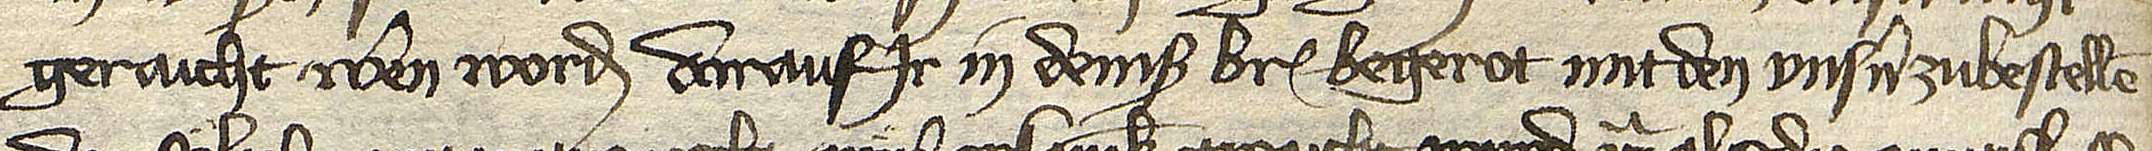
geraicht w*en word* Darauf Ir in demſ* br* begeret mit den vnſn* ʒubeſtelle*
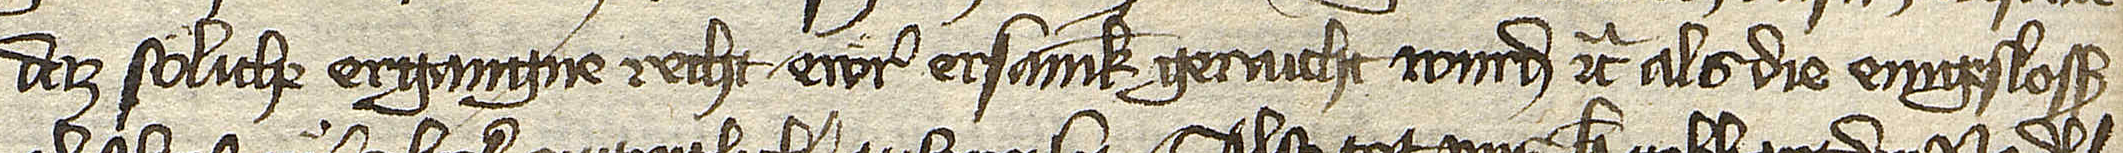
daʒ ſöliche ergangne recht / eẅr* erſamk* geraicht wurd* ec* als die eingeſloſſ*
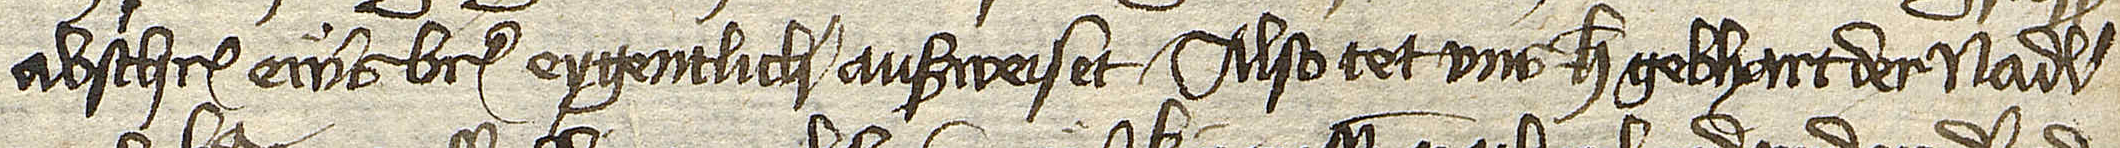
abſchr* eẅ*s br* eygentlich* auſʒweiſet / Alſo tet vns H* gebhart der Nadl*
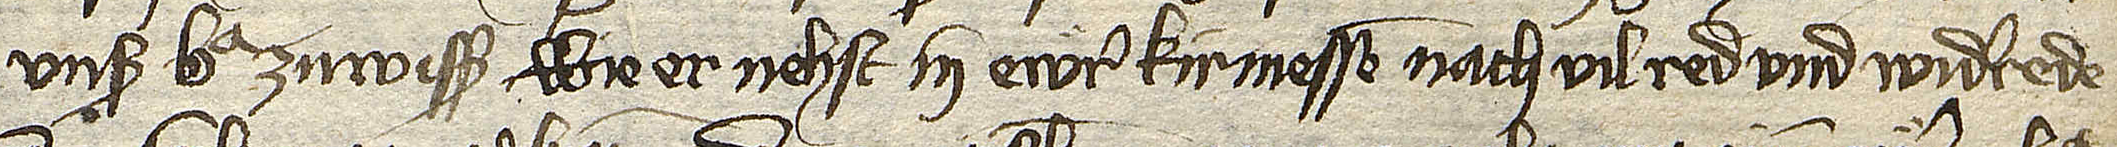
vnſ* b* ʒuwiſſ* / wie er nehſt in eẅr* kirmeſſe* nach vil red vnd wid*rede
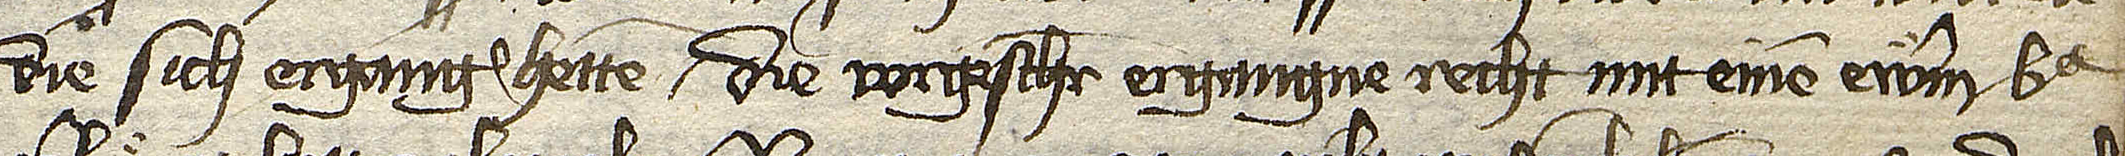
die ſich ergang* hette* / Die vorgeſchr* ergangne recht mit eine* eẅ*m b*
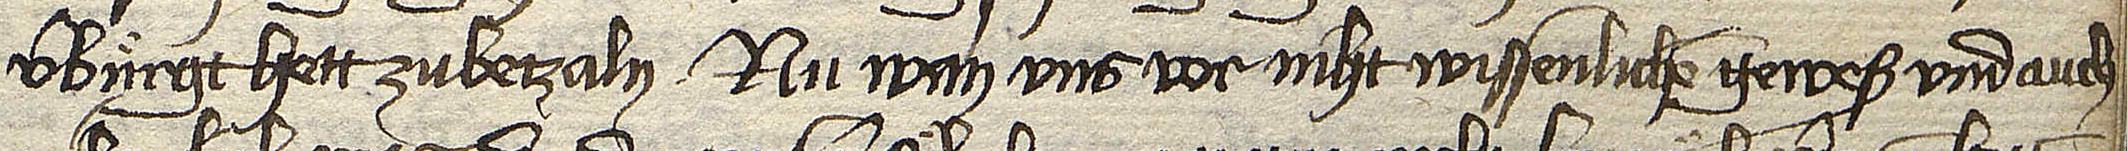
v*bürgt hett ʒu becʒaln . Nu wan vns vor niht wiſſenliche* geweſ* vnd auch
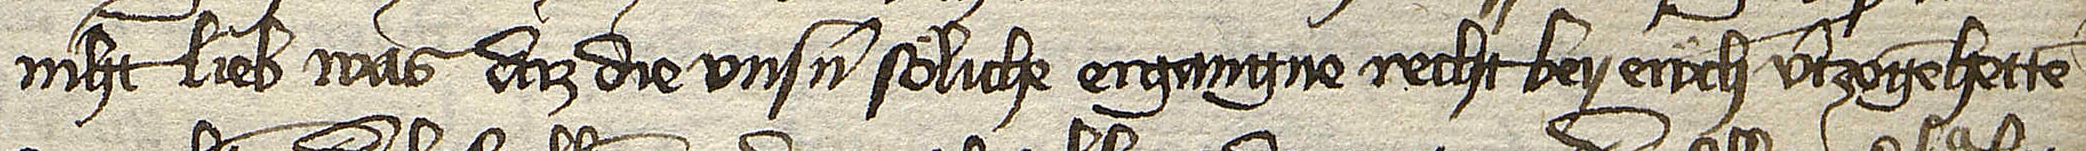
niht lieb was daʒ die vnſn* ſöliche ergangne recht bey eẅch v*cʒoge* hette*
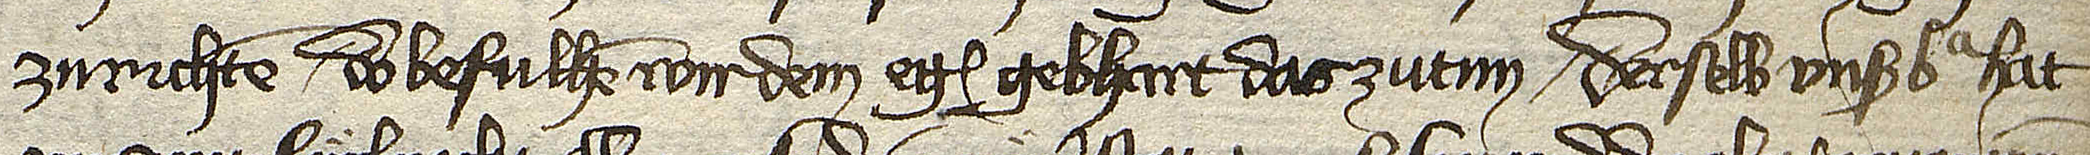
ʒu richte* / Do befulhe* wir dem eg* gebhart das ʒutun / Derſelb vnſ* b* hat
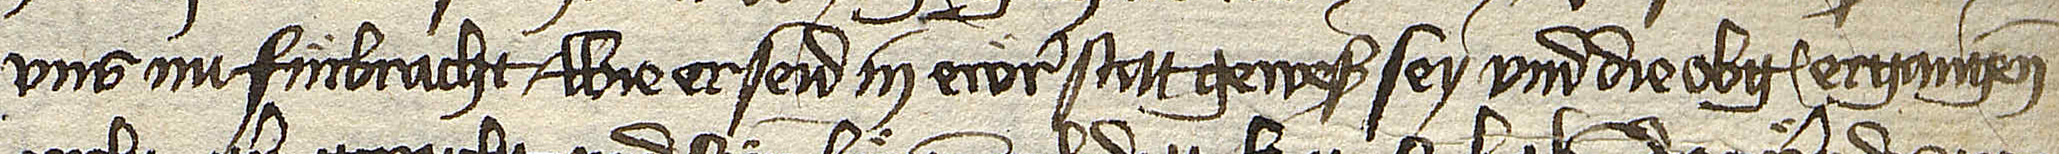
vns nu fürbracht / wie er ſeid in eẅr* ſtat geweſ* ſey vnd die obg* ergangen*
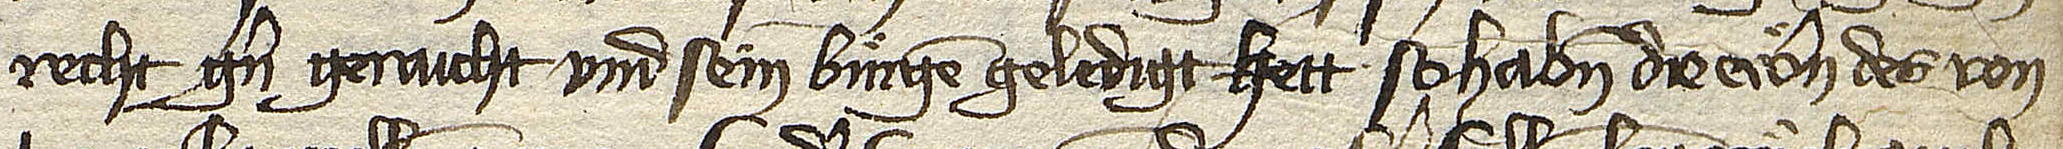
recht g*n geraicht vnd ſein* bürge* geledigt hett . ſo habn* die eẅ*n des von
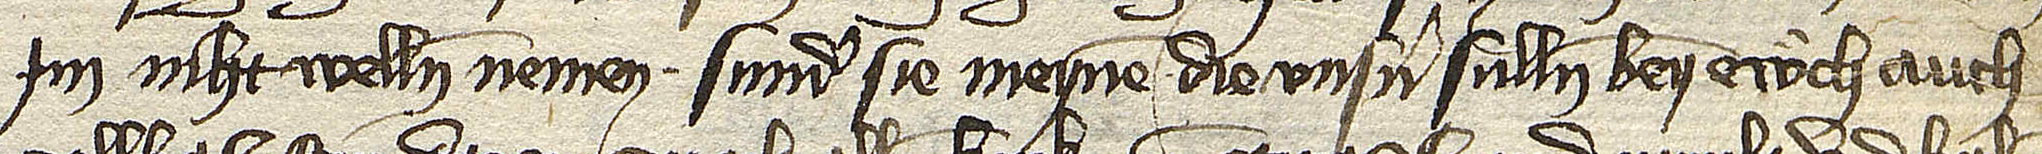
Im niht welln* nemen . ſund* ſie meyne* . die vnſn* ſulln* bey eẅch auch
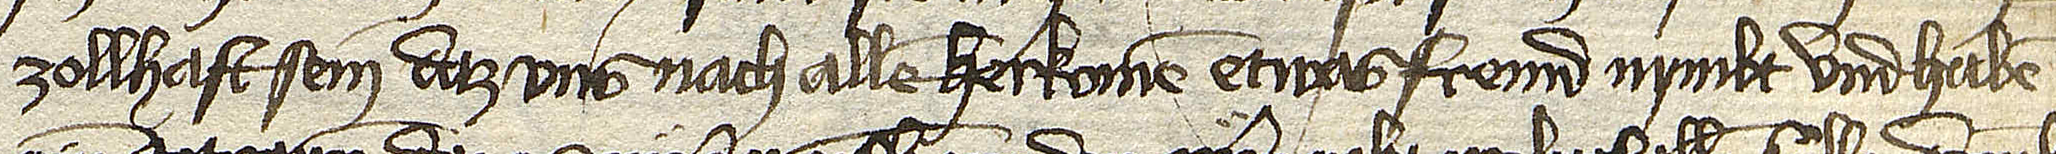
ʒollhaft ſein daʒ vns nach alle* herkome* etwas fremd nymbt vnd habe*
